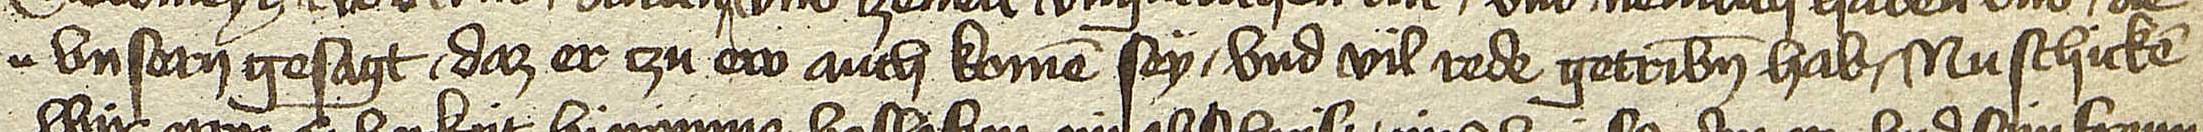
~ vnſern geſagt / daʒ er cʒu ew auch kome* ſey / vnd vil rede getribn* hab / Nu ſchicke*
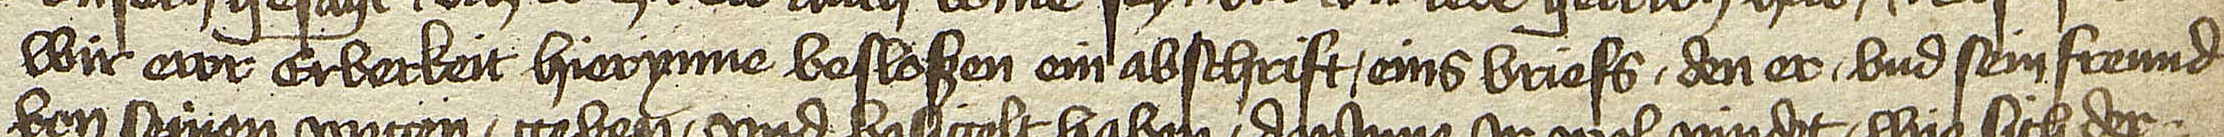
wir ewr Erberkeit hierynne beſloſʒen ein abſchrift / eins briefs / den er / vnd ſein freund
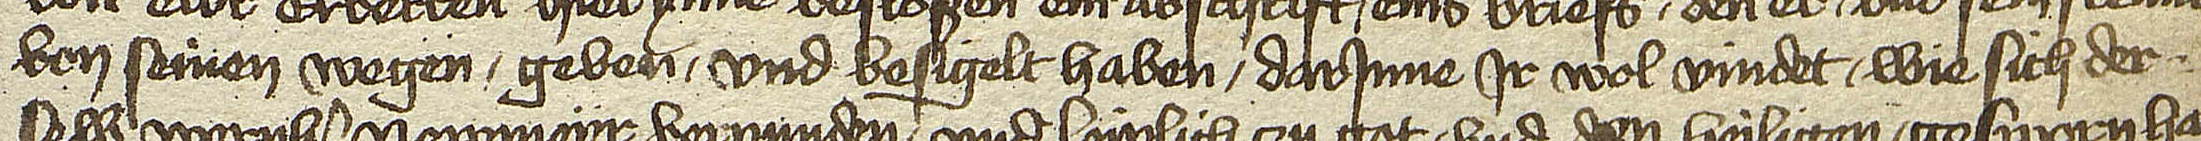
von ſeinen wegen / geben / vnd beſigelt haben / darInne Ir wol vindet / wie ſich der -
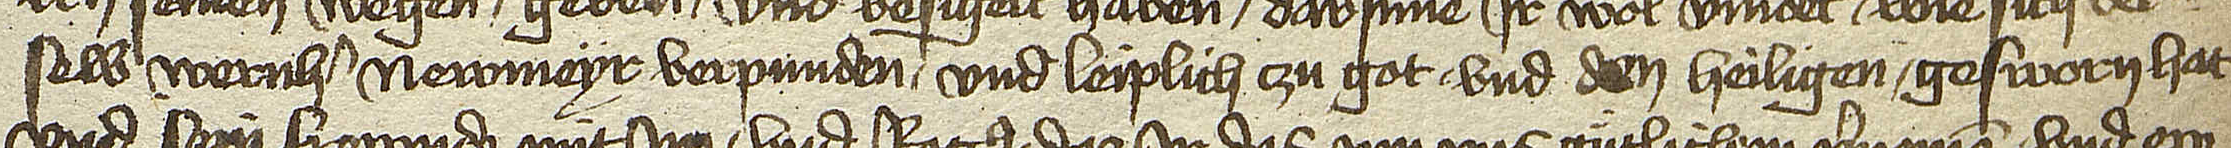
ſelb wernh* Newmeyr verpunden / vnd leiplich cʒu got / vnd den heiligen / geſworn hat
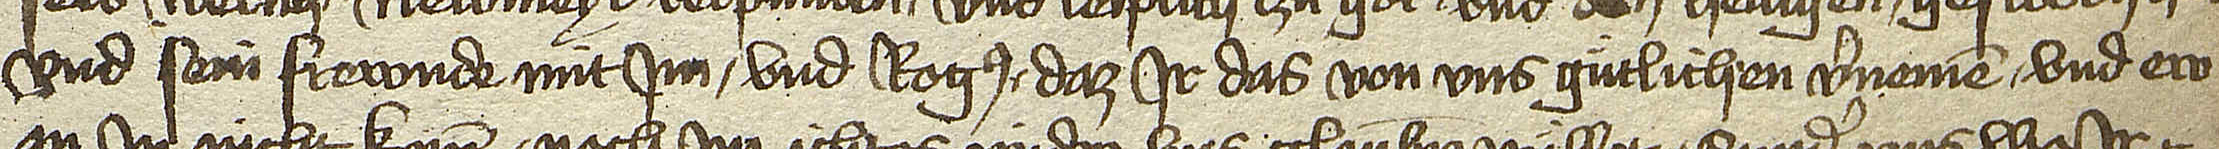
vnd ſein frewnde mit Im / vnd Ro* / daʒ Ir das von vns gütlichen v*neme* / vnd ew
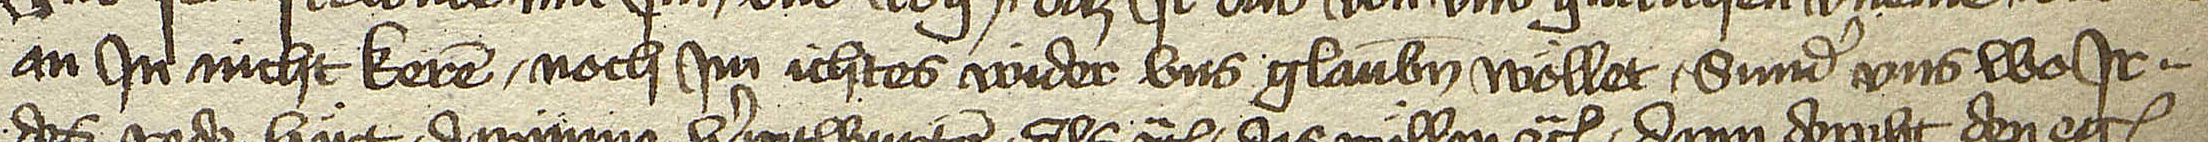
an In nicht kere* / noch Im ichtes wider vns glaubn* wöllet / Sund vns wo Ir ~
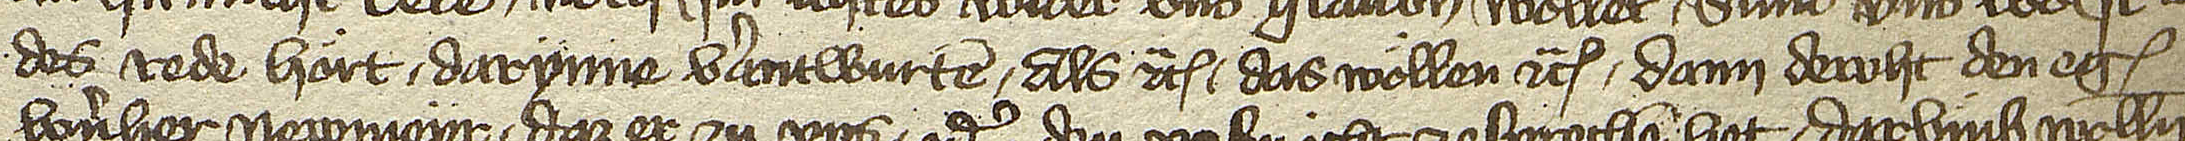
des rede hört / darynne v*antwurte* / Als ec* / das wöllen ec* / dann dewht den eg*
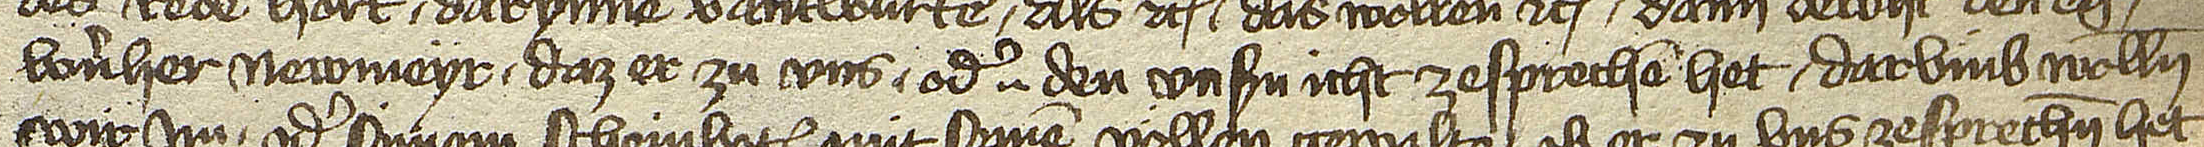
wn*her Newmeyr / daʒ er ʒu vns / od* ~ den vnſ*n icht ʒeſpreche het / darv̈mb wolln*
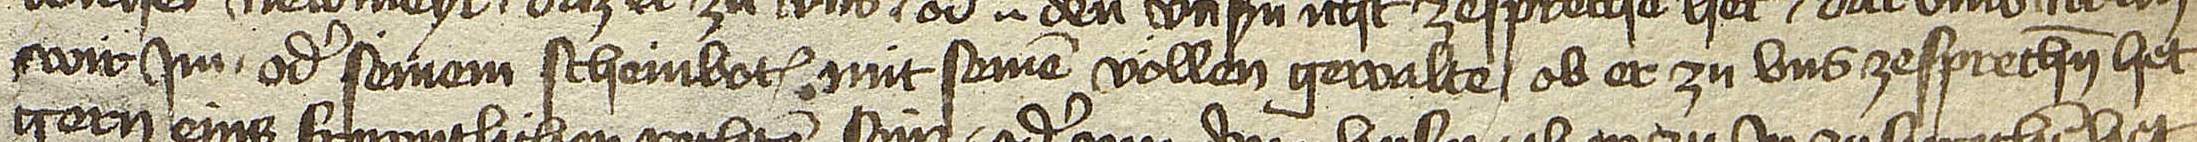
wir Im / od* ſeinem ſcheinbot* mit ſeine* völlen gewalte / ob er ʒu vns ʒeſprechn* het
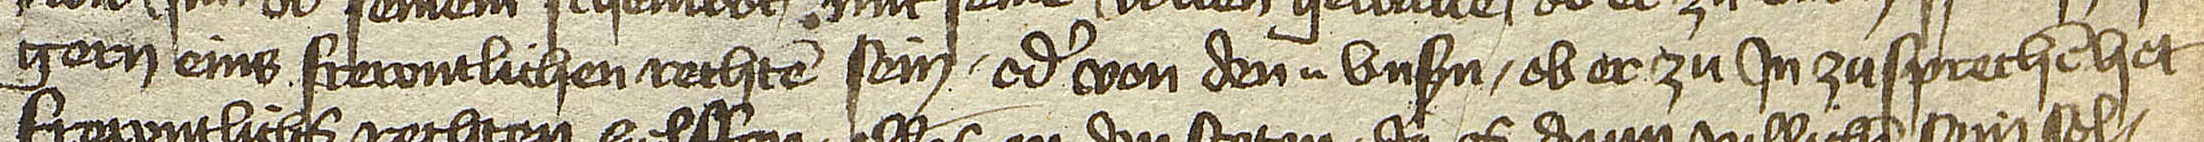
gern eins frewntlichen rechte* ſein / od* von den ~ vnſ*n / ob er ʒu In ʒuſpreche* het
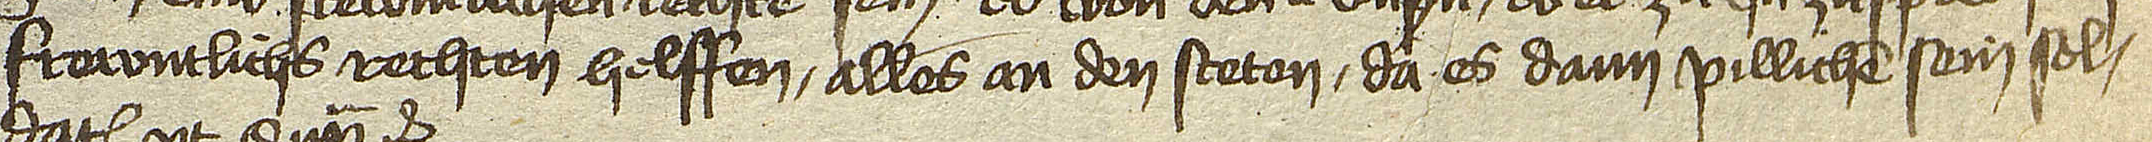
frewntlichs rechten helffen / alles an den ſteten / da es dann pilliche* ſein ſol*
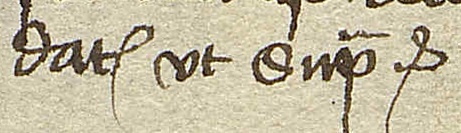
dat* vt Sup* §
